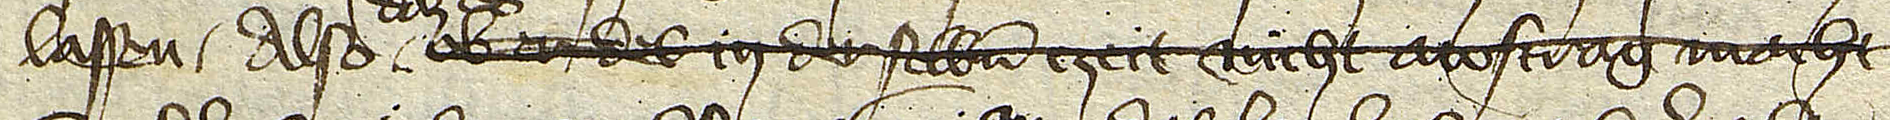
laſſen / Alſo / ob er des in derſelbn* cʒeit nicht awſtrag macht
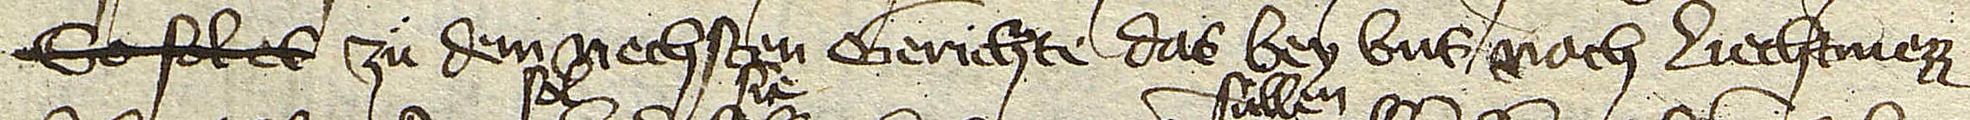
So ſol er cʒü dem nechſten Gerichte das bey vns nach Liechtmeʒʒ
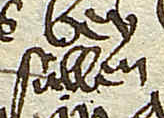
ſüllen
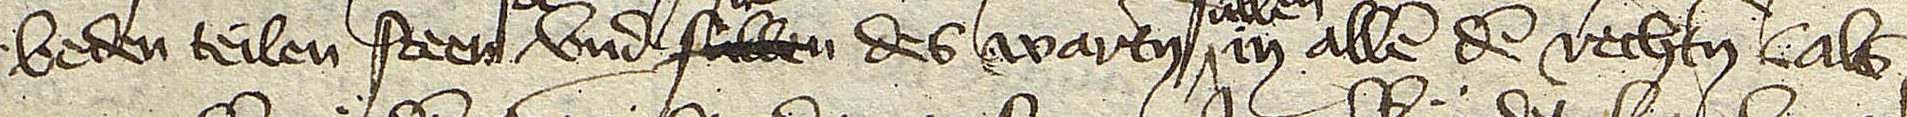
beden teilen ſteen / vnd ſüllen des wartn* in alle* d* rechtn* / als
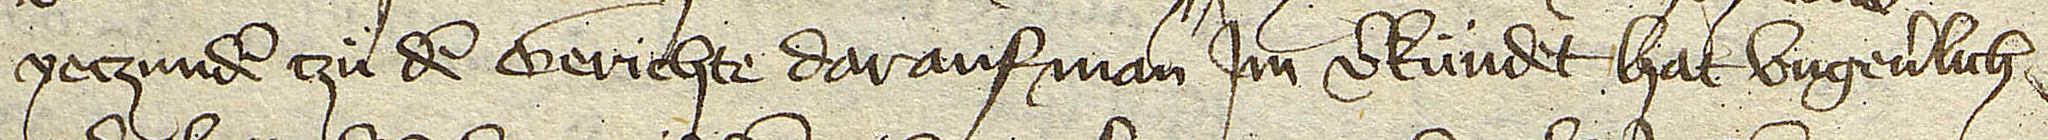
yecʒund* cʒü d* Gerichte darauf man Im v*kündet hat vngeu*lich
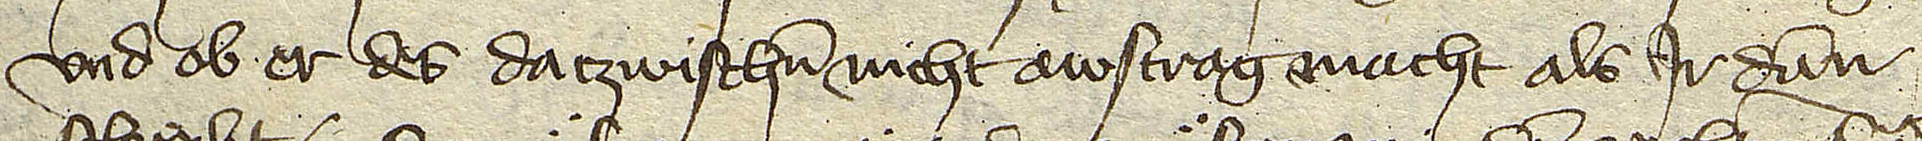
vnd ob er des da cʒwiſchn* nicht awſtrag macht als Ir dan*
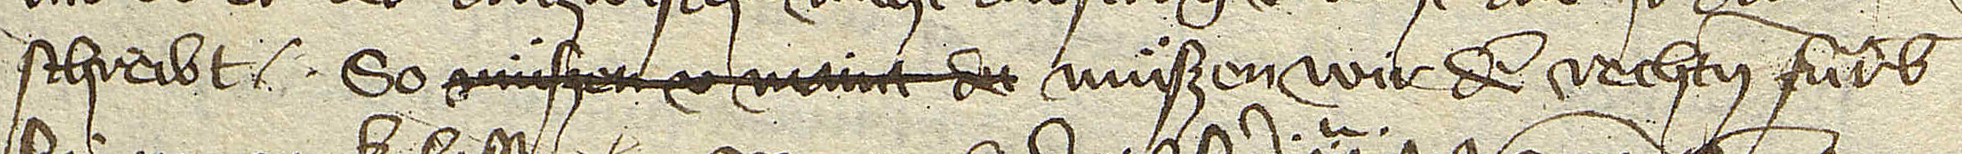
ſchreibt / . So müſʒen v maint de müſʒen wir d* rechtn* fürb*
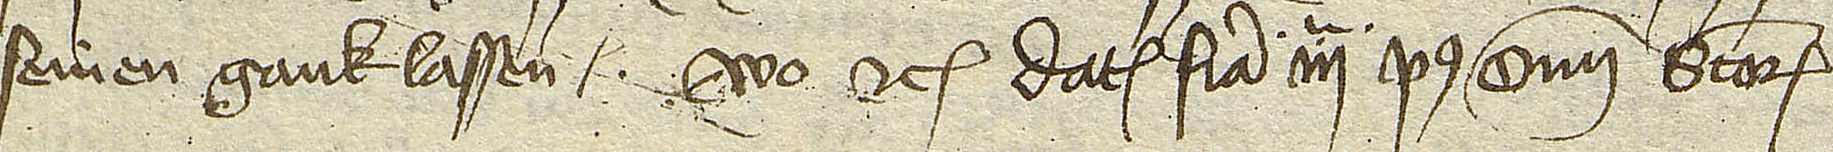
ſeinen gank laſſen / . wo ec* dat* fia* iii* p* Omi* Sco*
